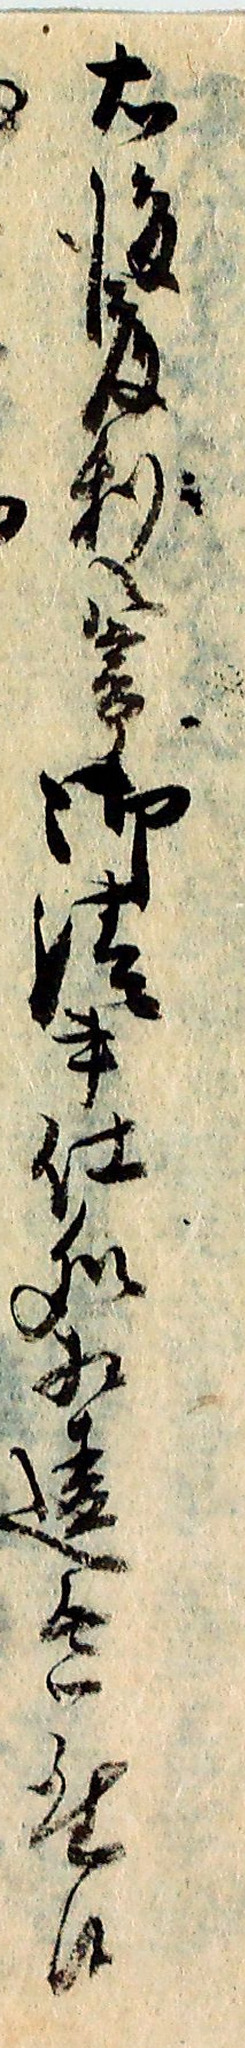右後藤利八郎御請書仕処相違無御座候
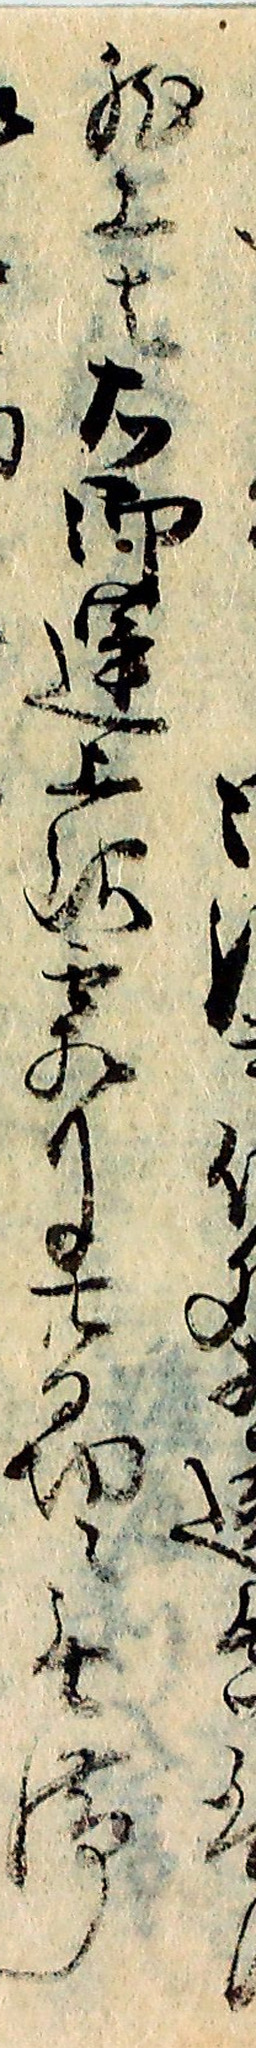然上は右御運上銀霜月廿日切に無滞
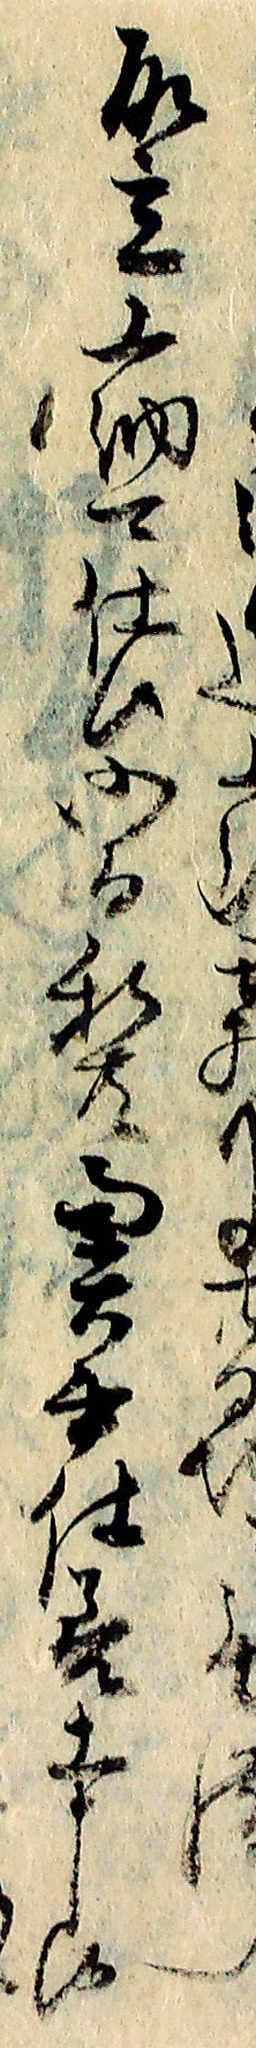取立上納可仕候仍て私共奥書仕差上申候以上
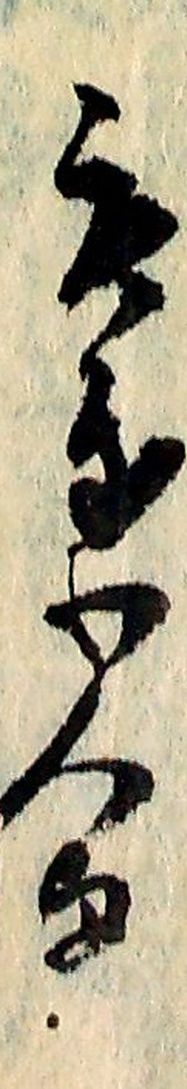庄屋五人与
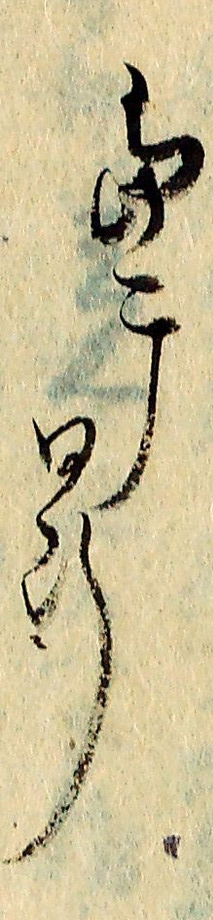当テ同断
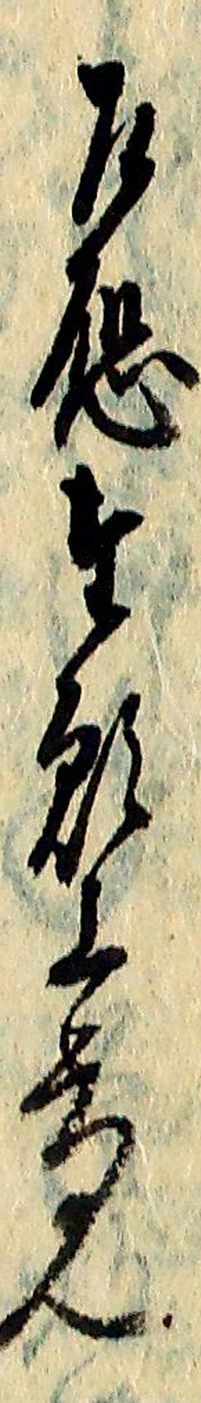乍恐奉願上覚
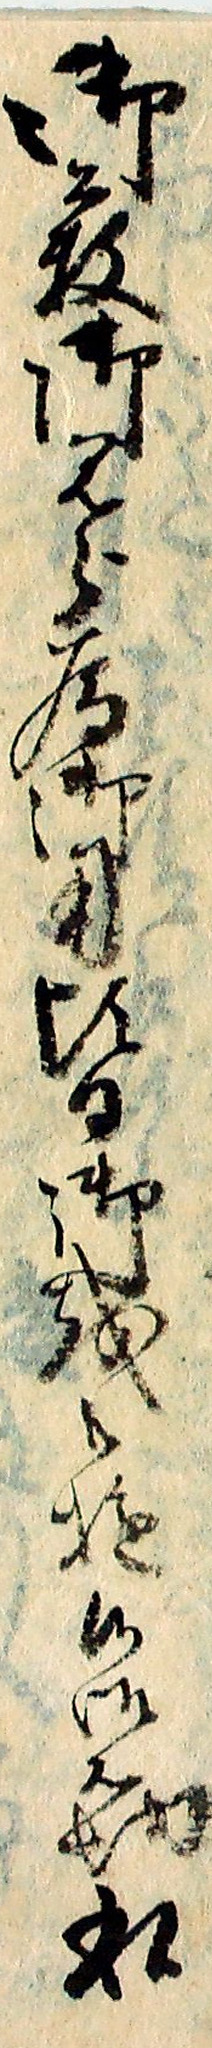御藪御見分為御用頃日御越被遊候御砌私
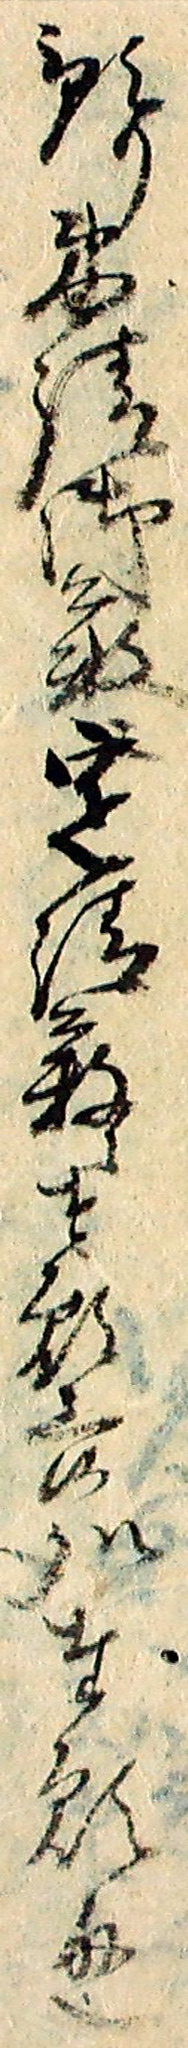預り束請御藪定請藪に奉願上候処奉願通
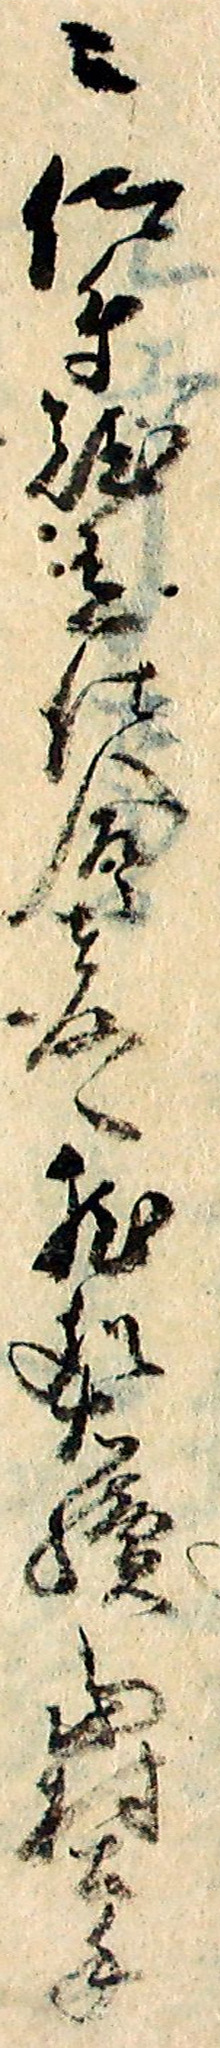被仰付難有仕合に奉存候然処右続当村土手
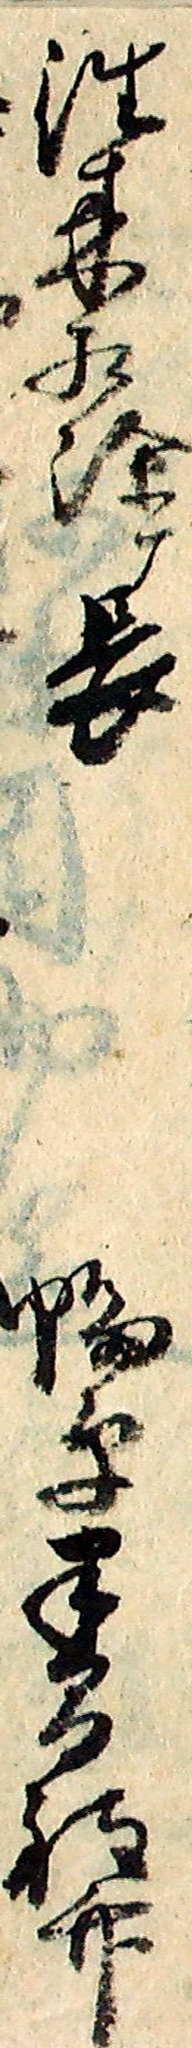往来相除け長幅平半間程竹
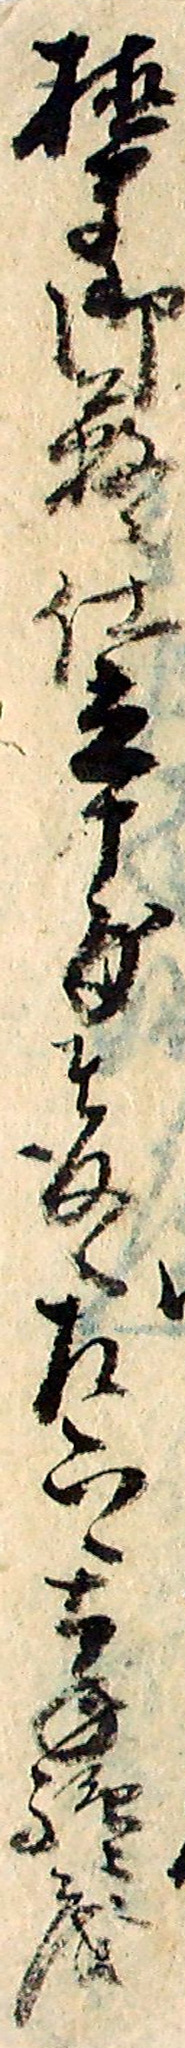植付御藪に仕立申度奉存候左候はゝ土手強にも

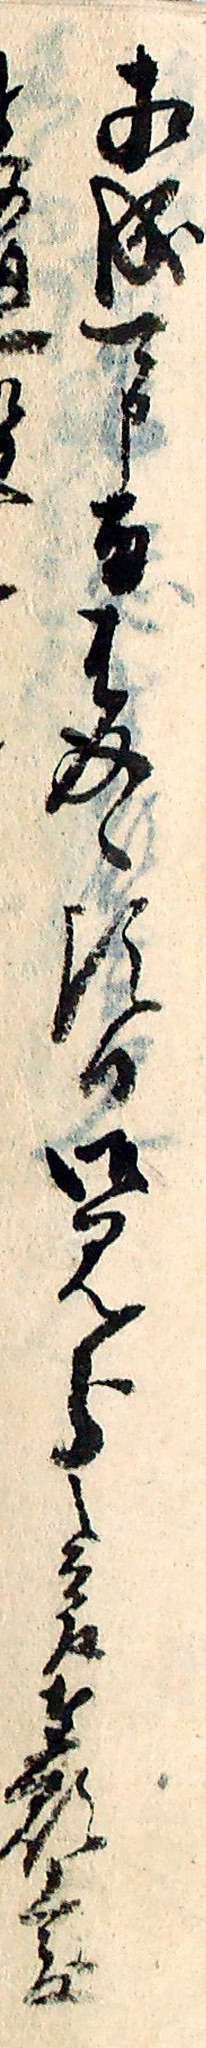相成可申と奉存候頃日御見分之節奉願上度
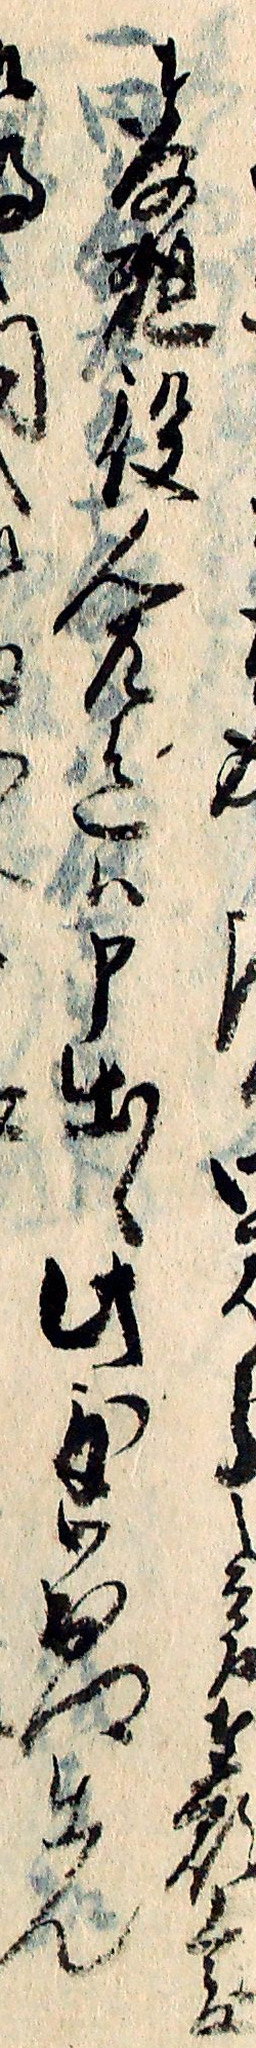奉存役人共迄は申出候此度御出郷先
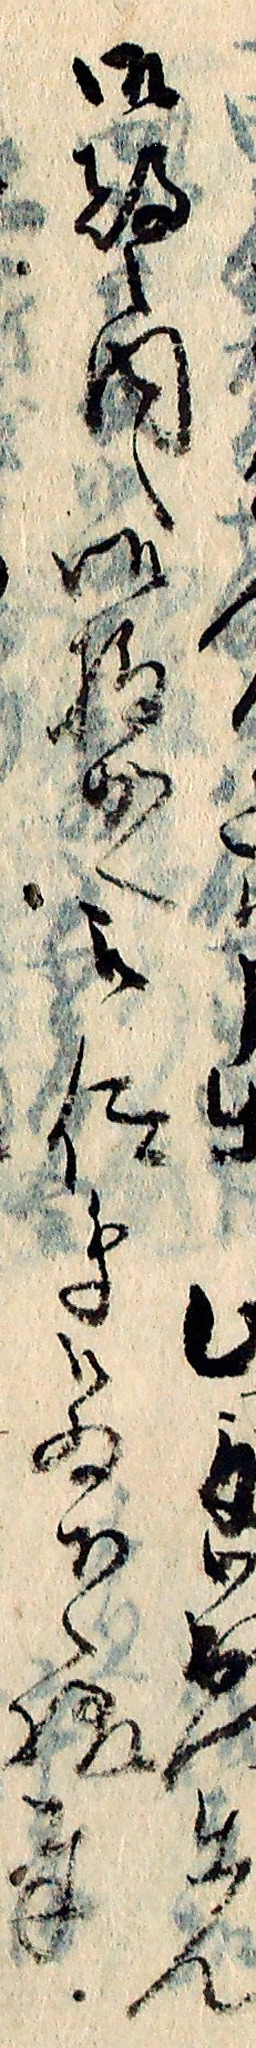御都之内へ御指加へ被仰付被為下候様奉
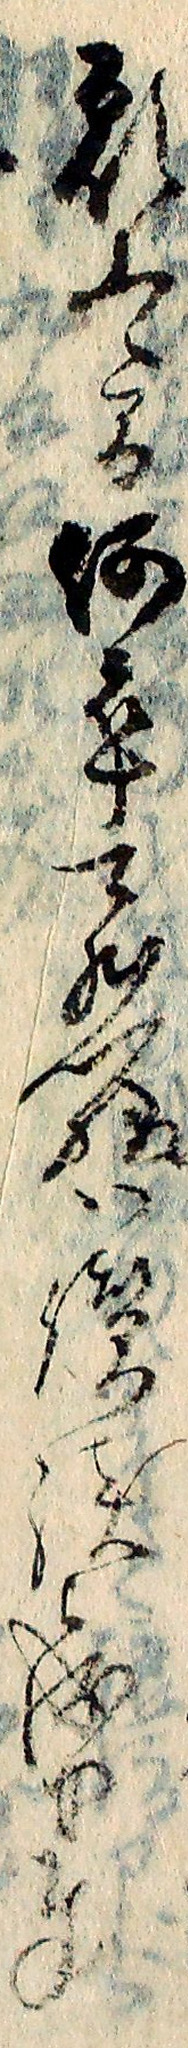願上候間何卒可然様御讃談被成下奉
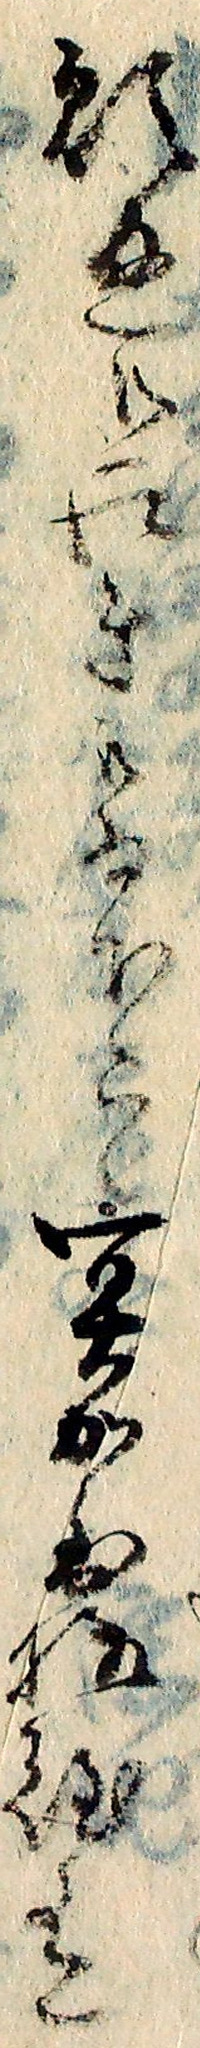願通被仰付被為下候はゝ冥加至極難有
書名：諸御願書控(後藤氏壱番）
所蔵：鳴門教育大学 Naruto University of Education
